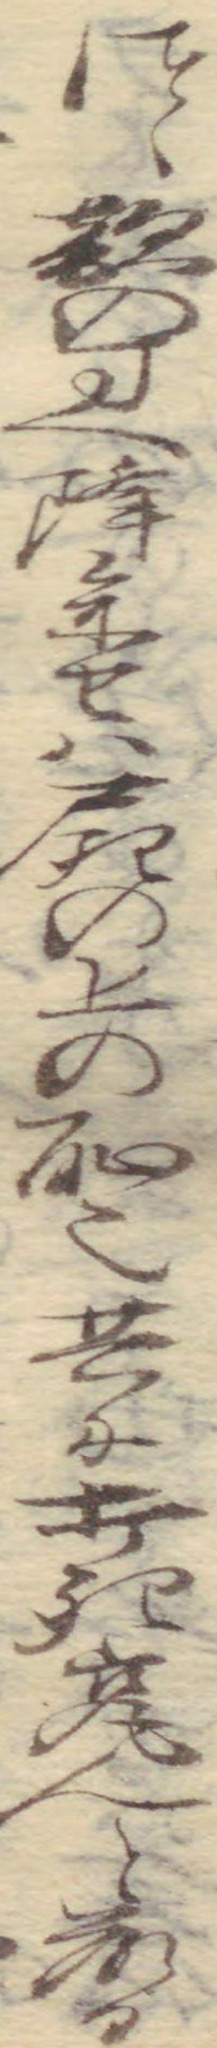つゝ敵の方へ降参せは屍の上の恥也共に打死究んと落る
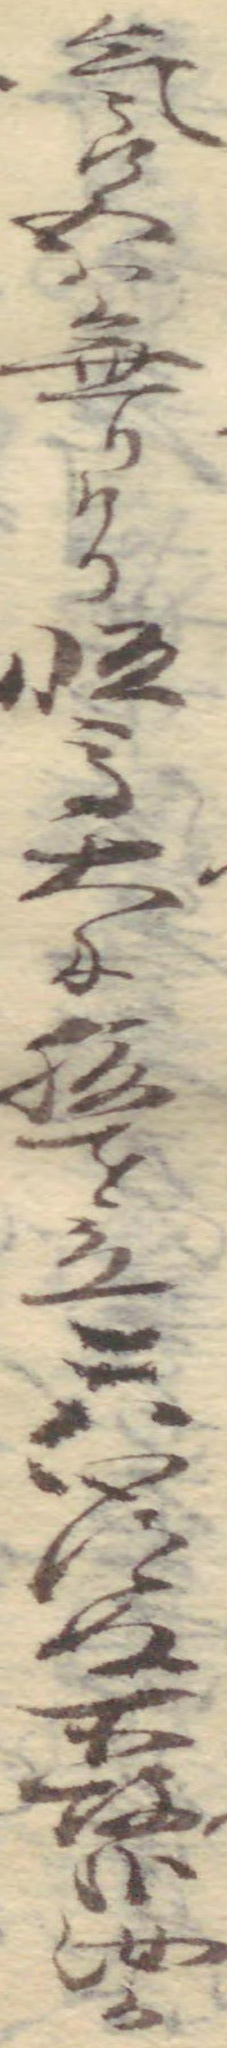気色は無りけり恒高大に腹を立こは心得ぬ所存哉汝か
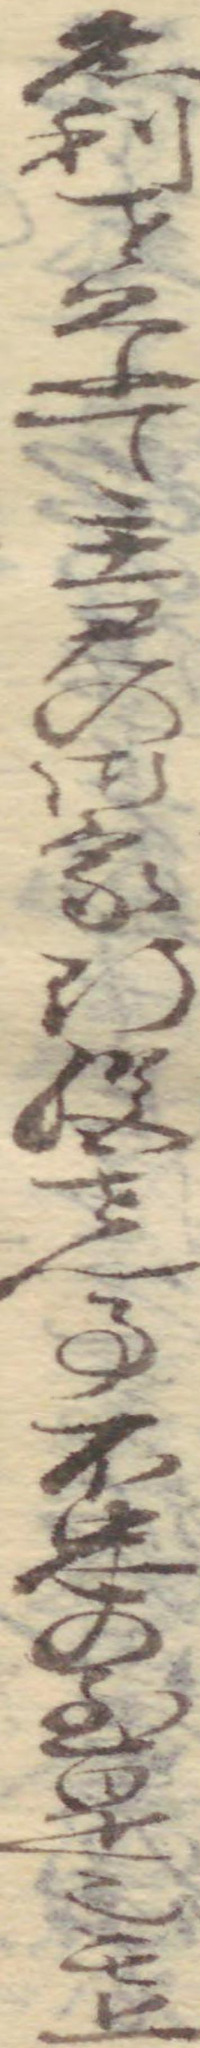名利を思ふて主君の御家断絶せん事不忠の至是也其上
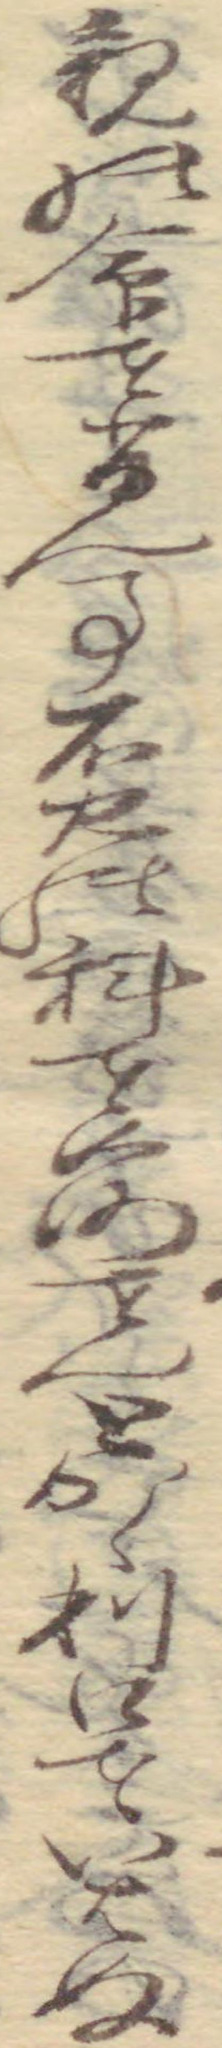親の命を背ん事不忠の科を如何せんとかく利口をいはぬ
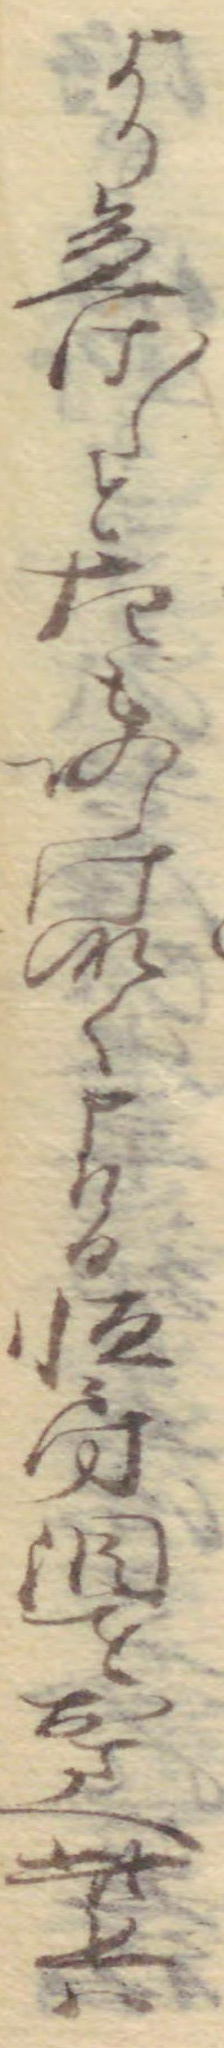より急け〳〵と左もあらけなく申ける恒房泪をおさへ此上は
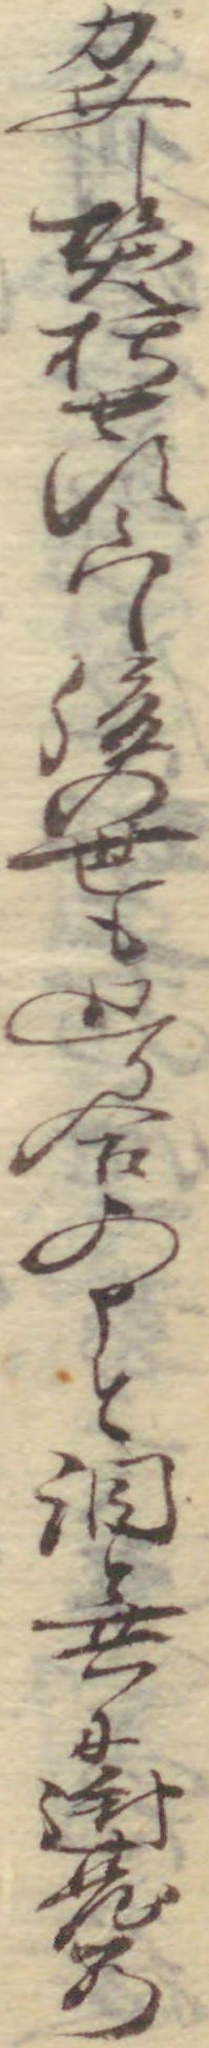力なし契朽せす候はゝ後の世も廻り合可申と泪と共に御台若
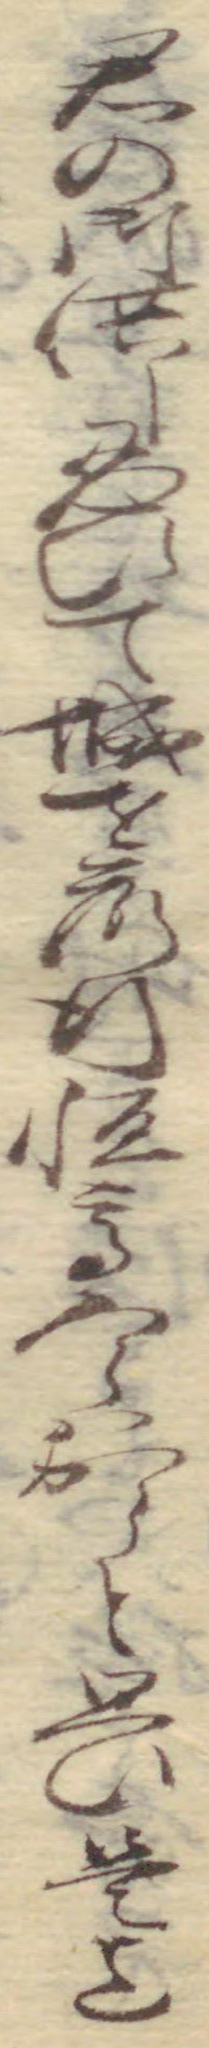君の御供し忍ひて城を落行恒高今はかくと思ひ是迄
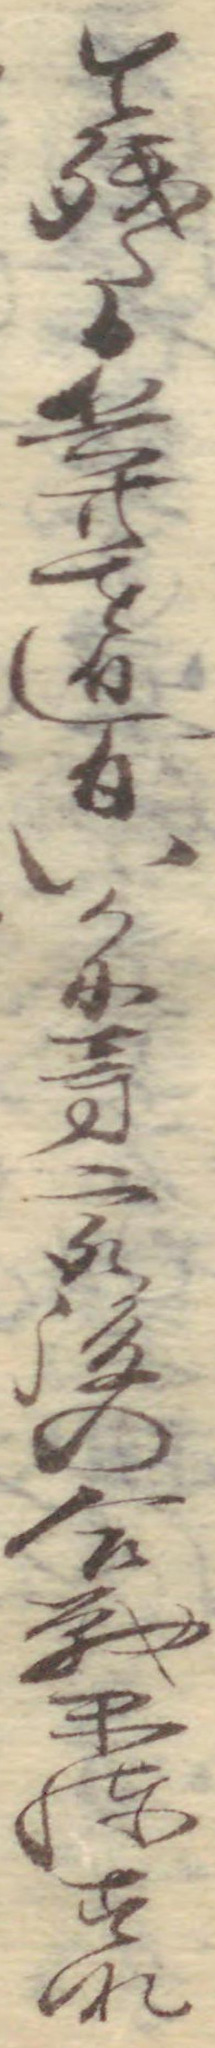と残たる兵共を近付いかに旁最後の合戦未練すな
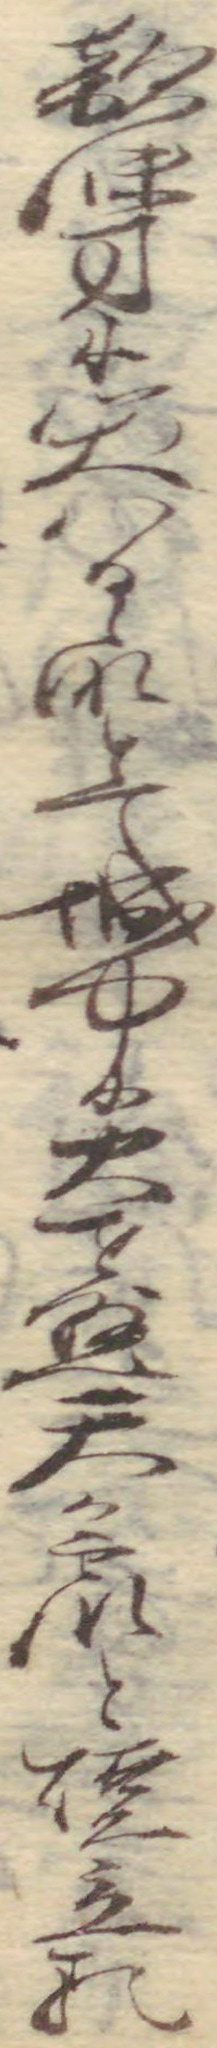敵味方に笑はるゝなとて城中に火を懸天か霞と煙立る
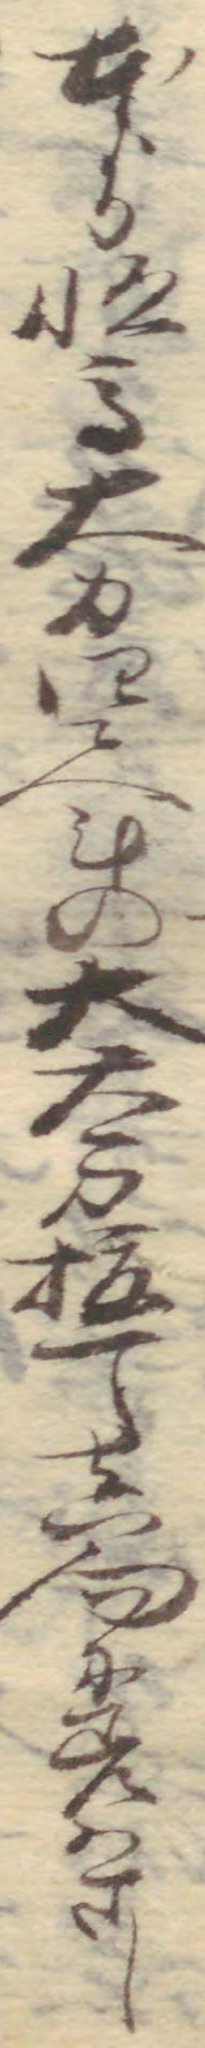本より恒高大力四尺斗の大太刀抜て真向に差かさし
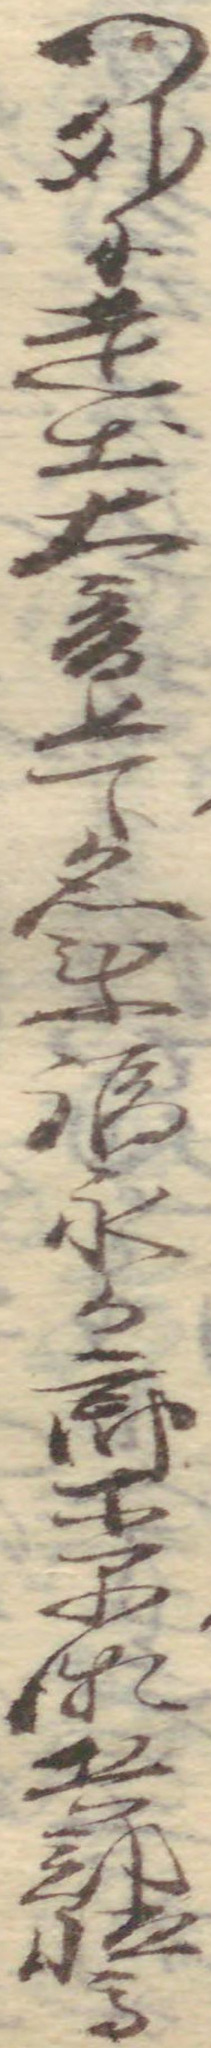門外に走出大音上て名乗福永か郎等早瀬兵部恒高
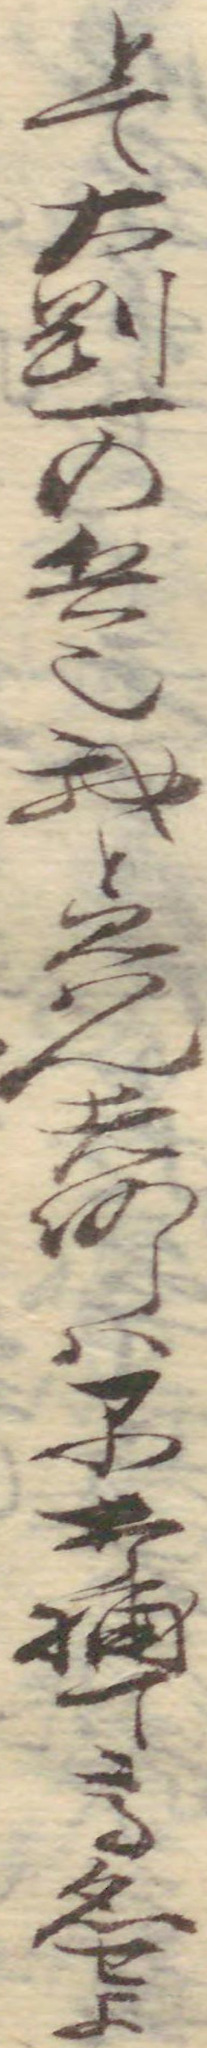とて大剛一の兵也我と思はん者あらは早打捕て高名せよ
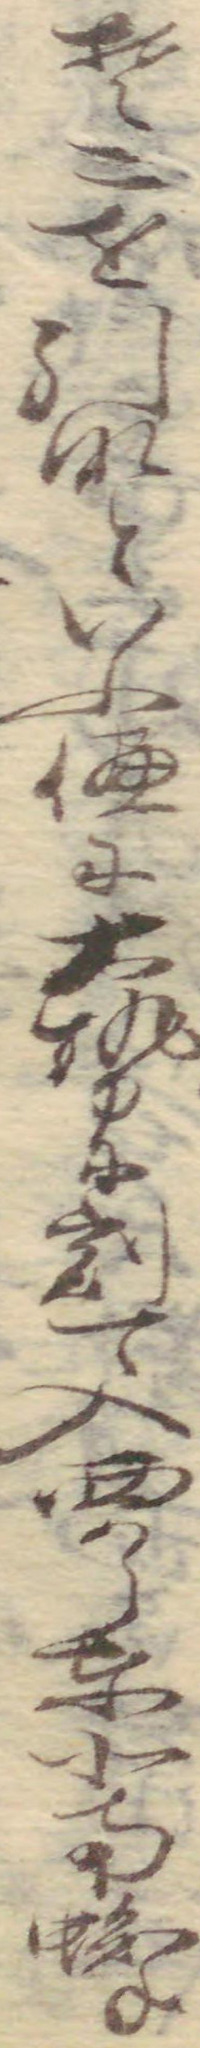そこを引なといふ儘に大勢に割て入西から東北南蜘手
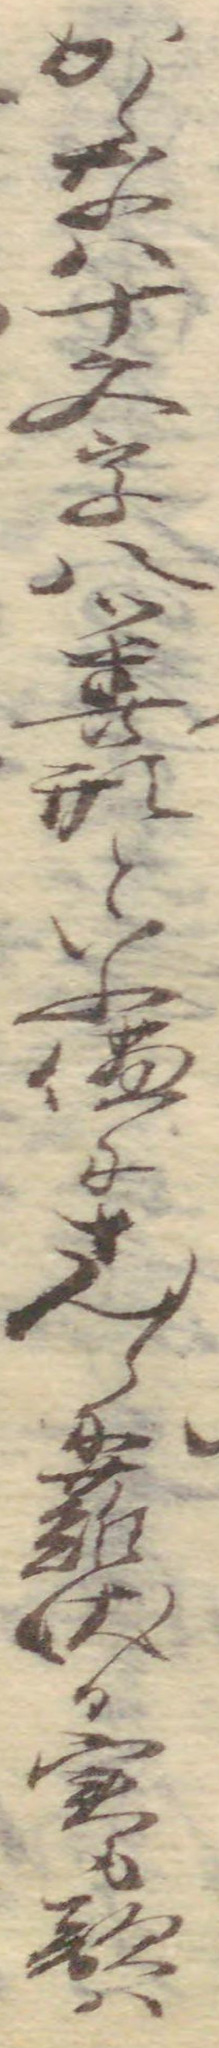かくなは十文字八ツ華形といふ儘にさん〳〵に薙伏る実も敵は
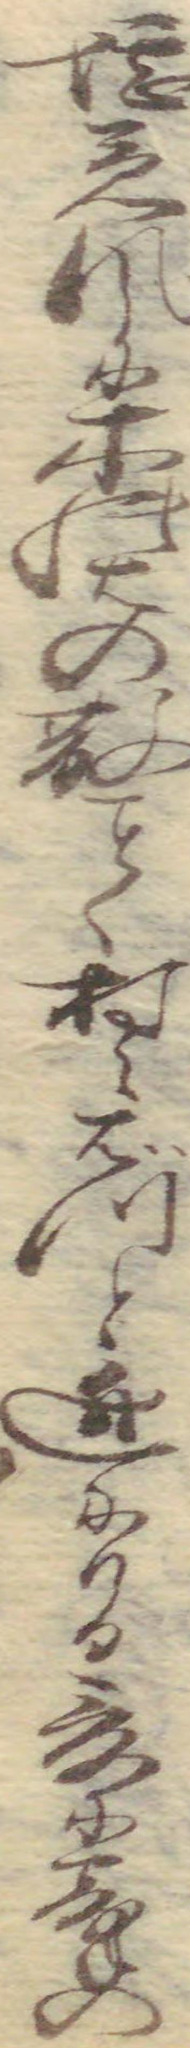堪兼風に木のはの散ことく村々ばつと逃にける爰に寄手の
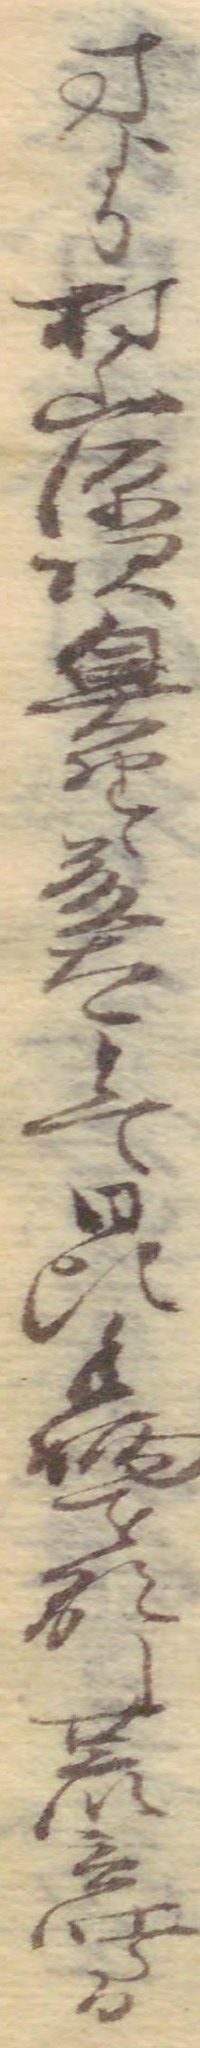方より村山源次奥野々藤太とて日頃手柄を顕し荒言吐たる
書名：鶯宿雑記. 巻199-200
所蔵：国立国会図書館 National Diet Library, JAPAN
